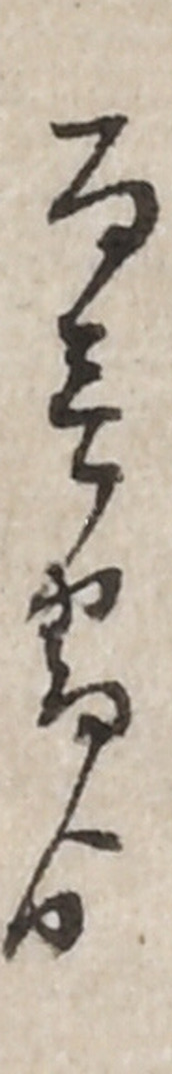百壱番ゟ
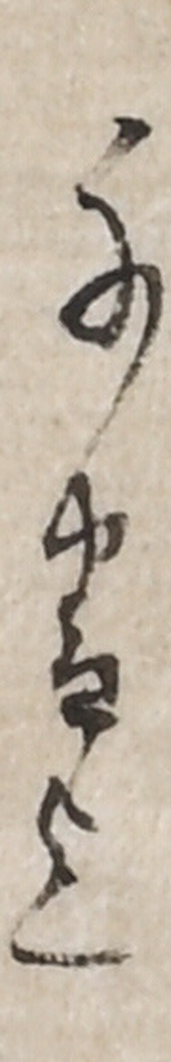千番迄
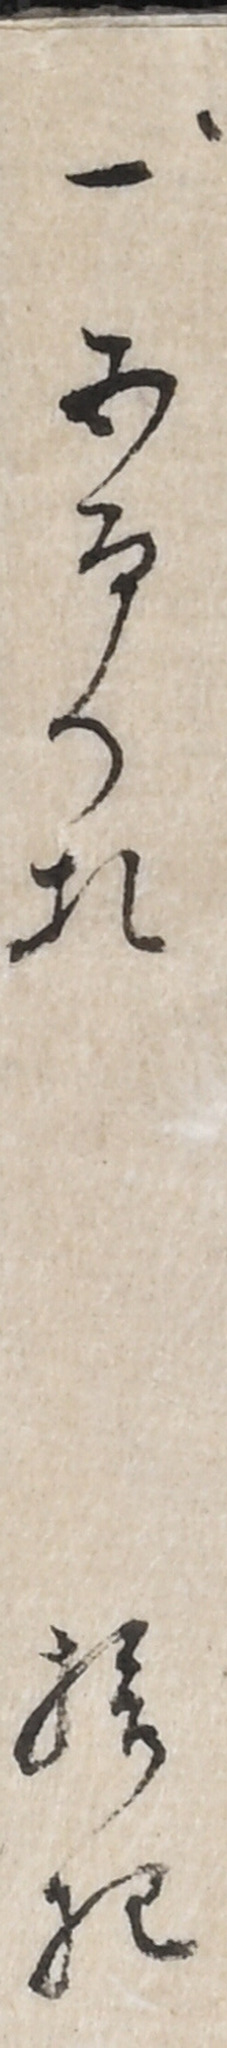一五百人札拾把
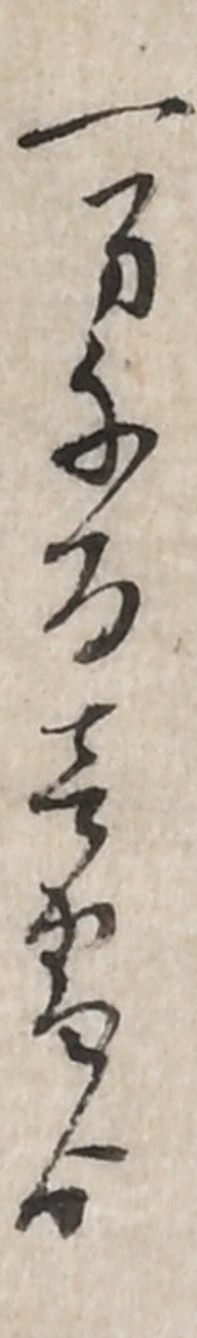一万千百壱番ゟ
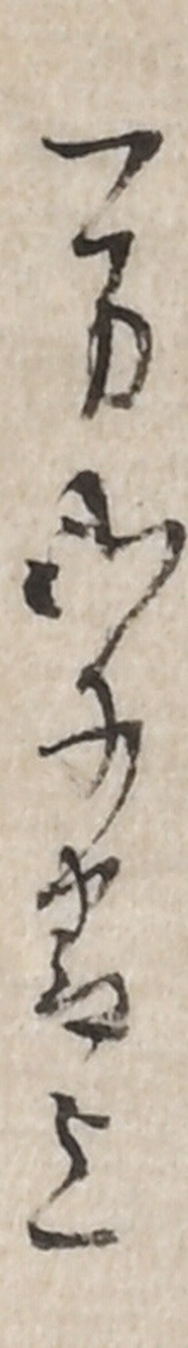一万弐千番迄
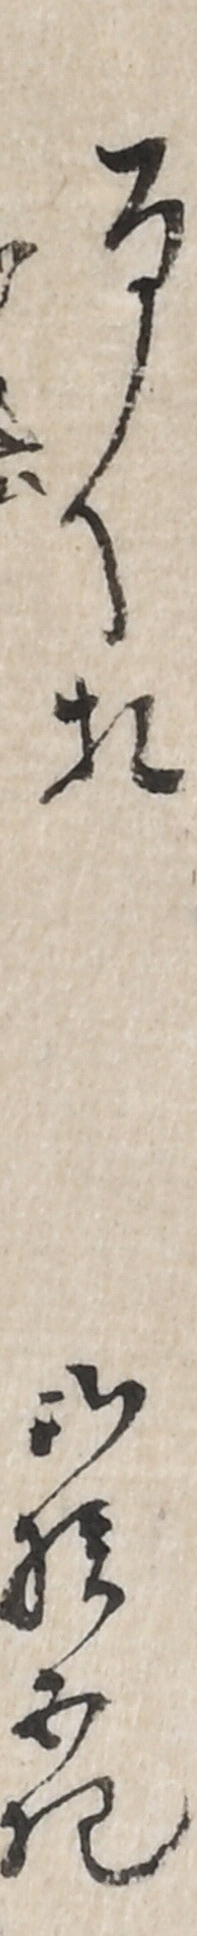一百人札弐拾五把
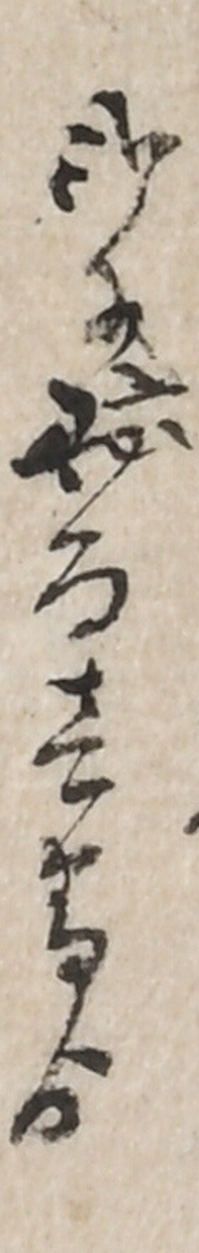弐千六百壱番ゟ
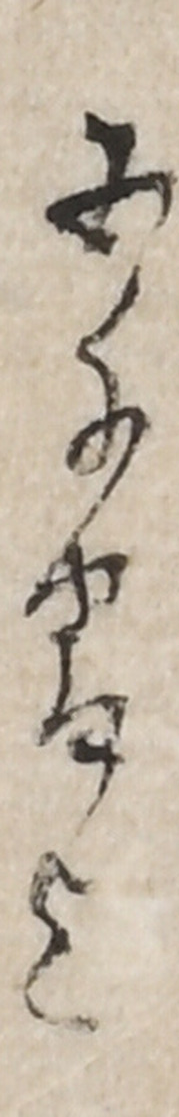五千番迄

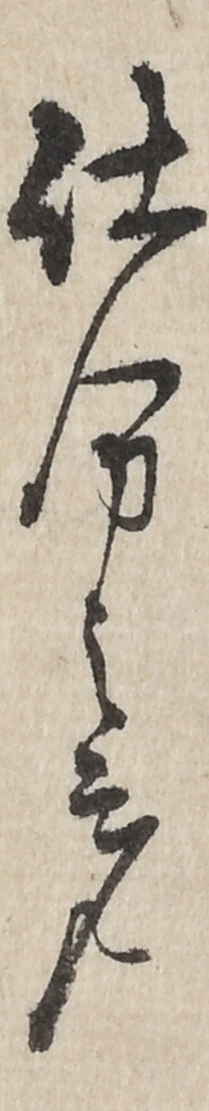仕分之覚
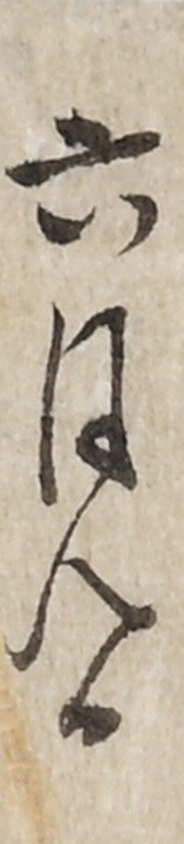六月八日
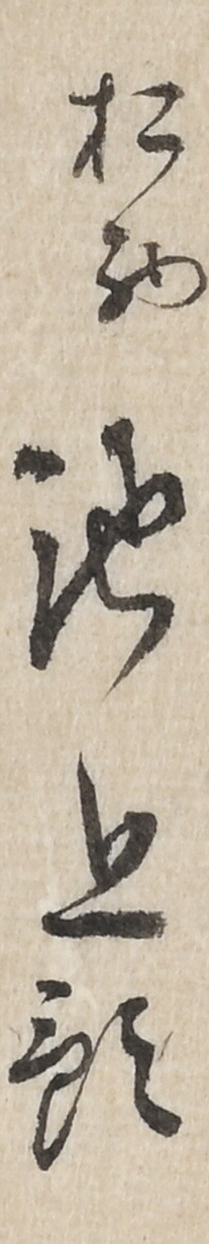於西池上預
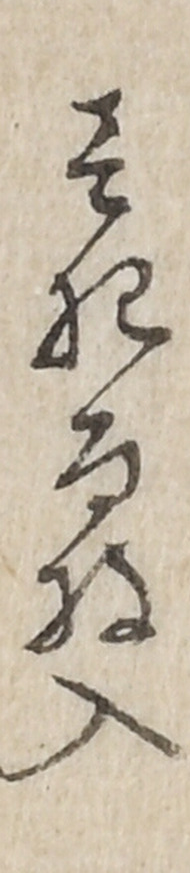壱把百枚入
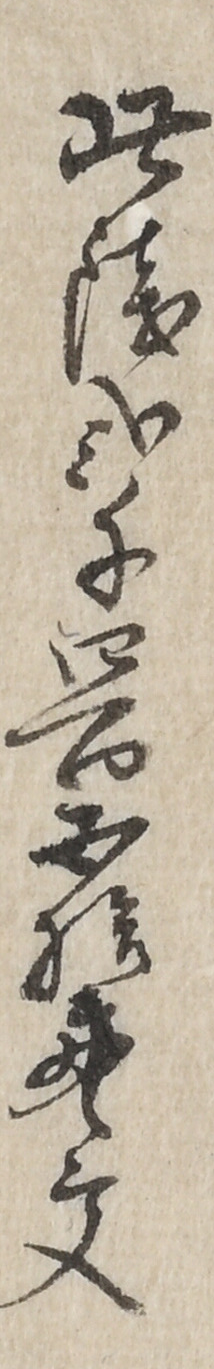此銭弐千四百五拾貫文
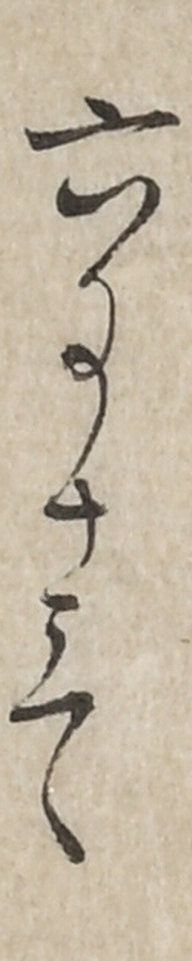六月十三日
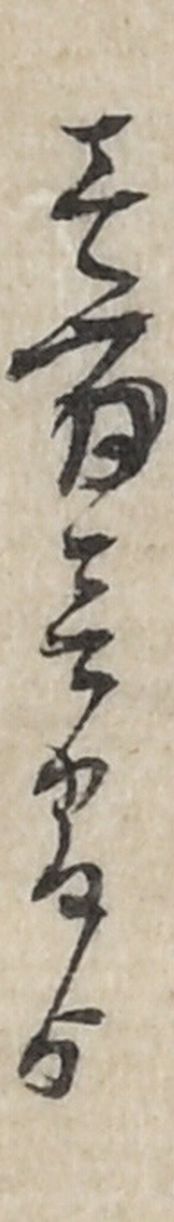壱百壱番ゟ
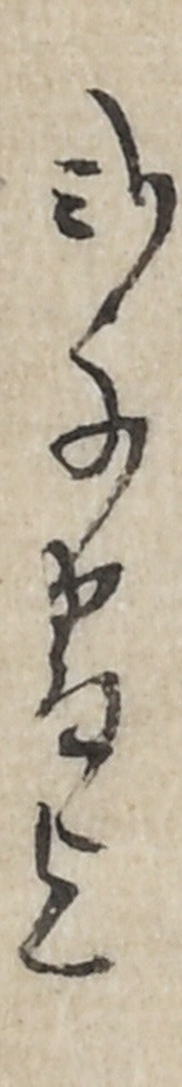弐千番迄
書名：髙遠限楮幣引換ニ付御下ケ渡控
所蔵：伊那市立高遠町図書館・合同会社AMANE
